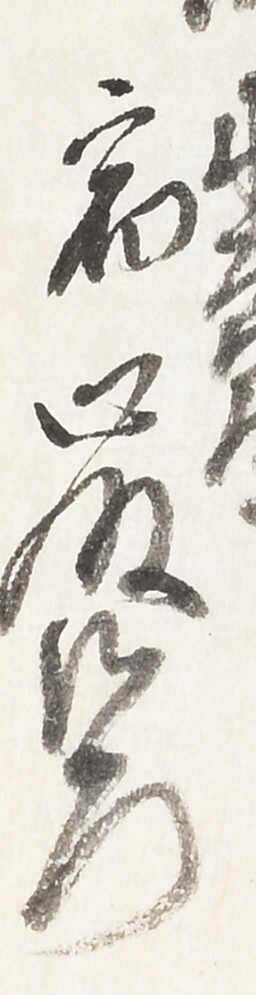宿籐左衛門
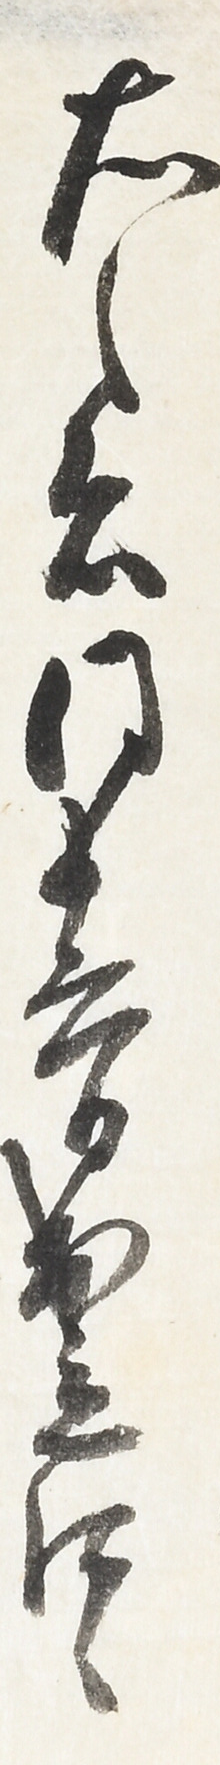右之者同十六日出立仕候
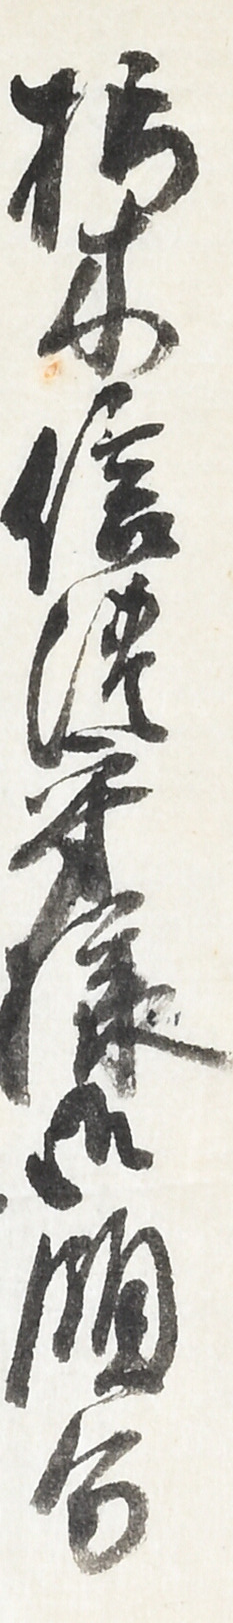朽木信濃守様御領分
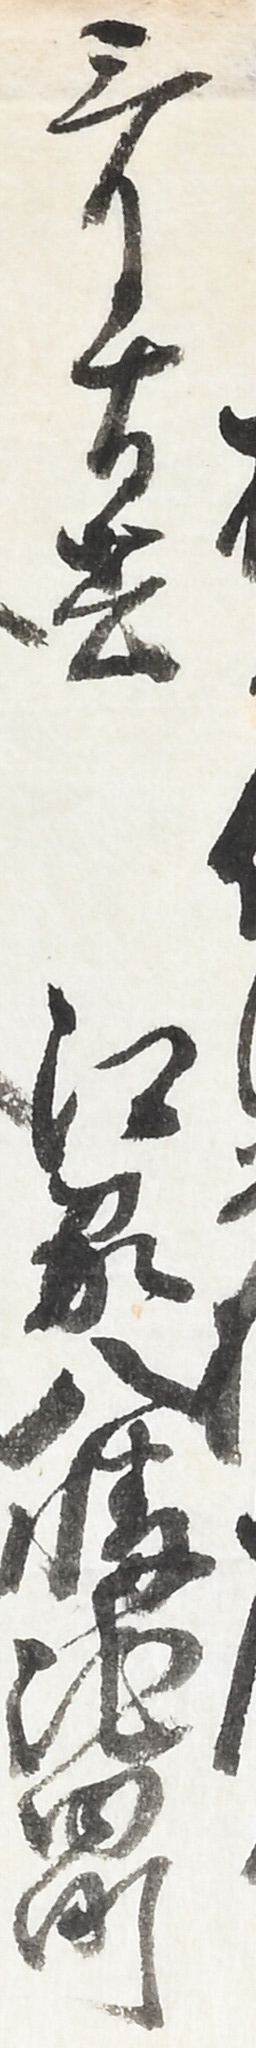三月十日着江州八幡池田町
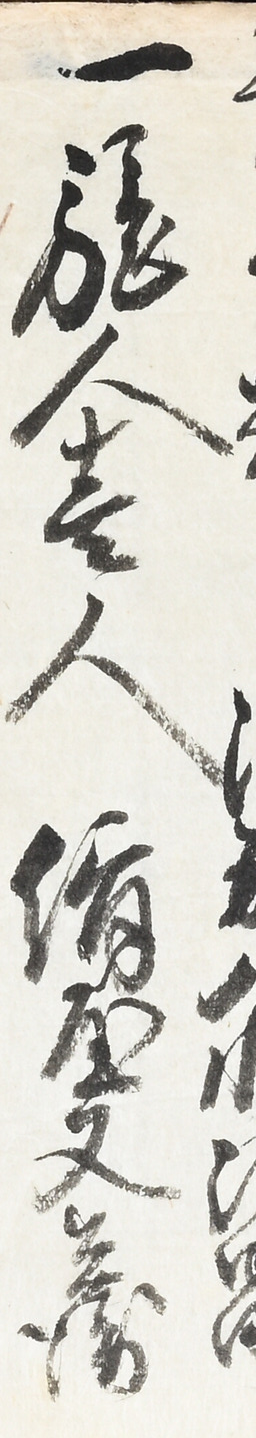一旅人壱人絹屋又兵衛
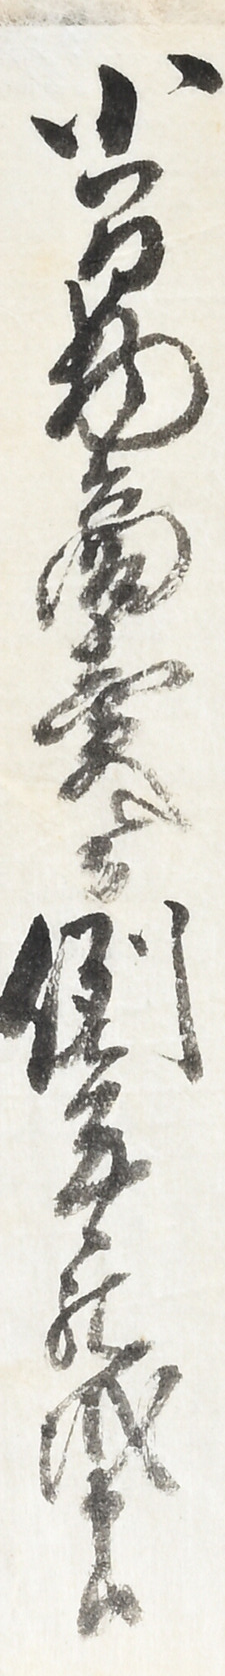小間物商売ニ而例年罷越申候

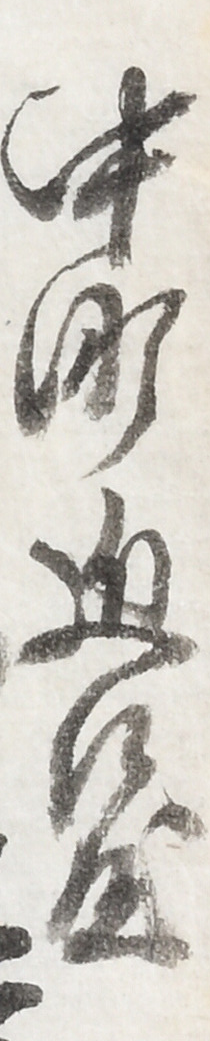中町近江屋
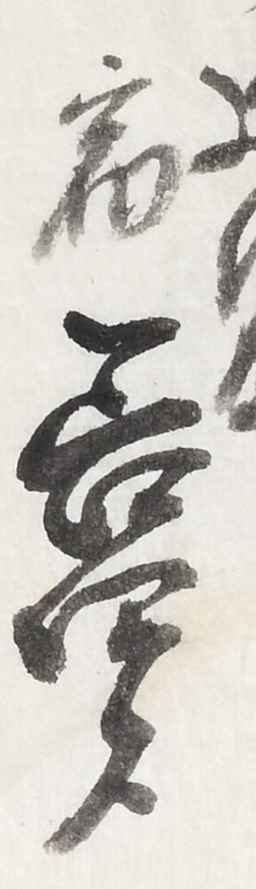宿善四郎
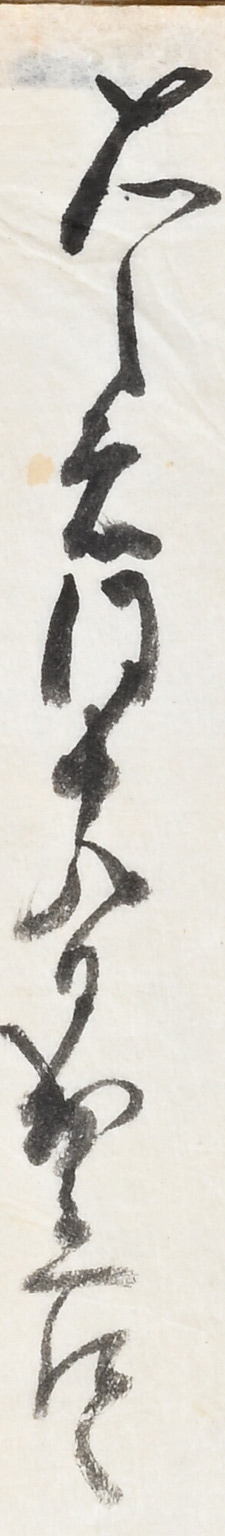右之者同十八日出立仕候
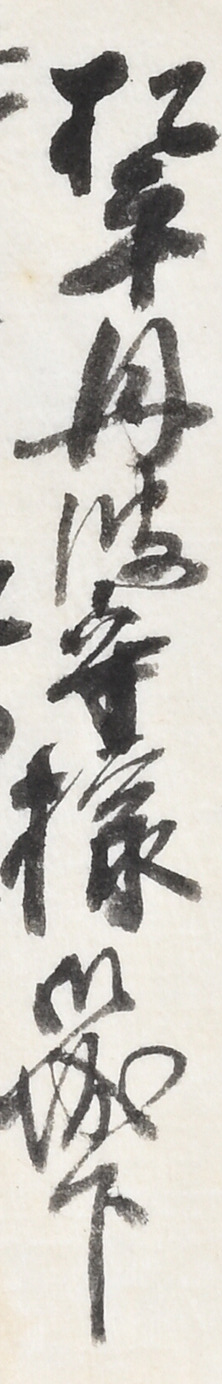松平丹波守様御城下
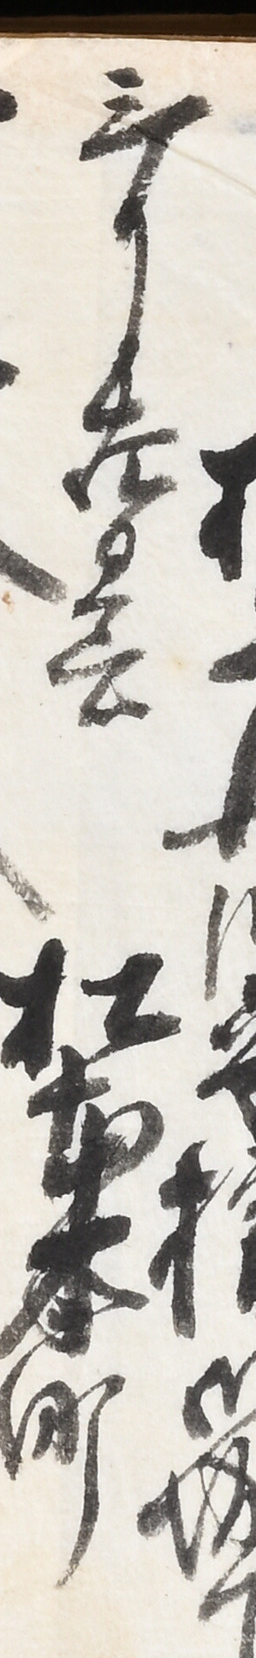三月十四日着松本本町
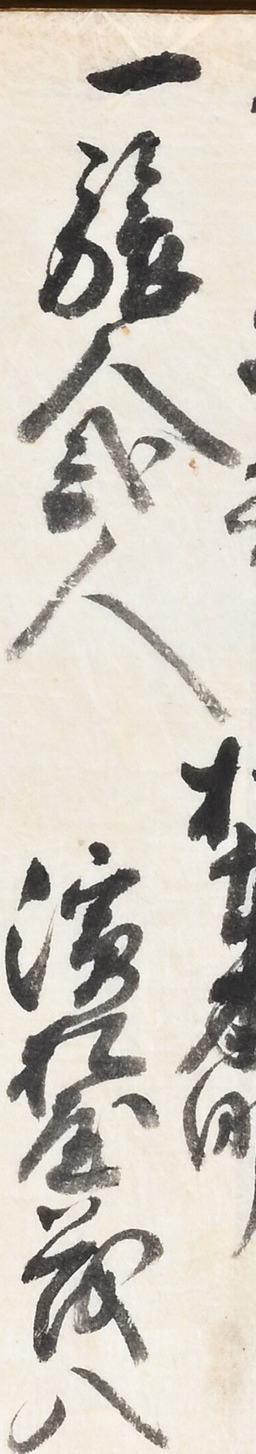一旅人弐人濱松屋茂八
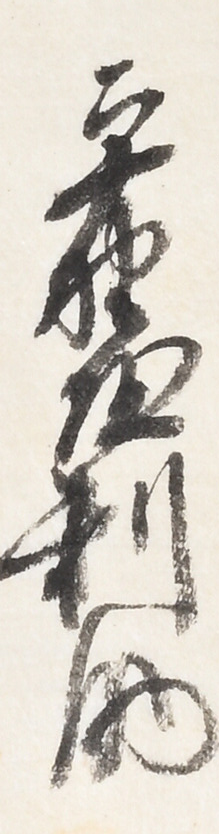平野屋利助
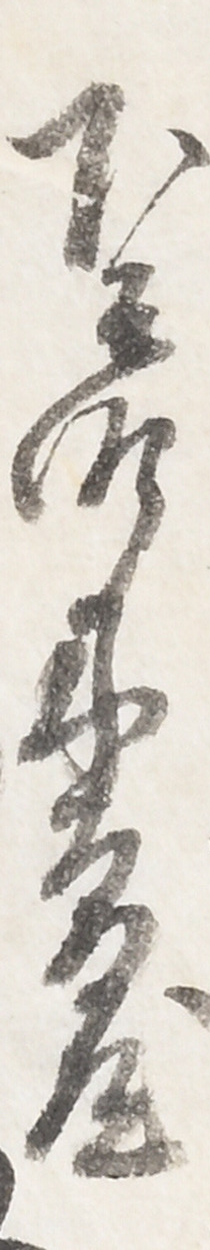下モ町木曽屋
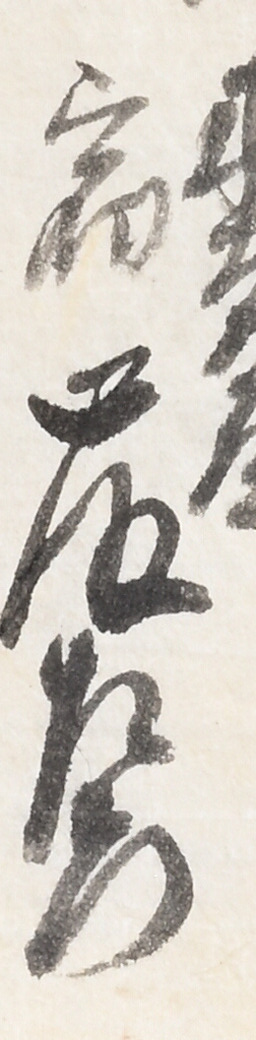宿籐左衛門
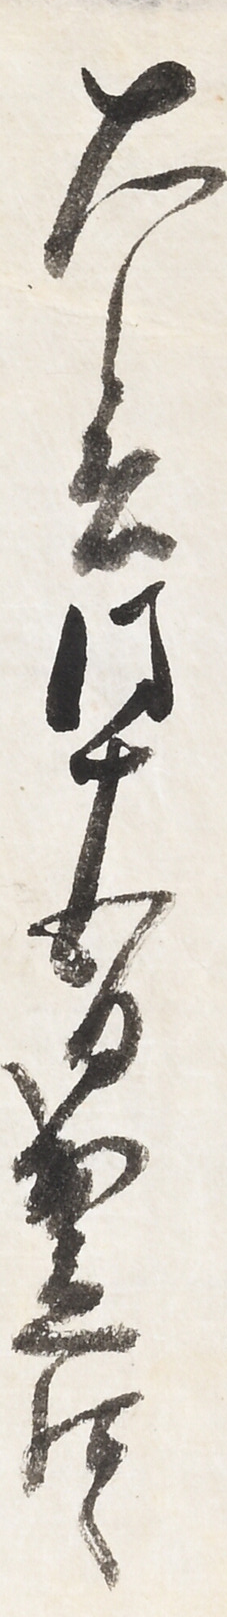右之者同十五日出立仕候
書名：旅人泊控帳
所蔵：伊那市立高遠町図書館・合同会社AMANE
